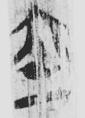○（牙）
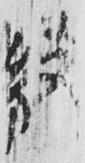級（隰）
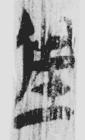○（朋）
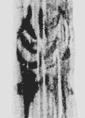與
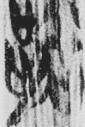○（鮑）
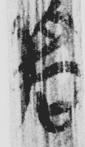○（叔）
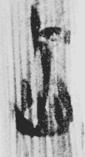○（牙）
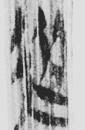從
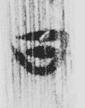日
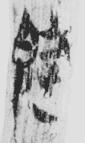既
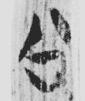公
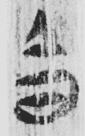昏（問）
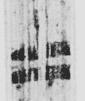二
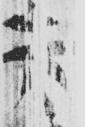大夫
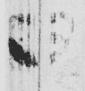日
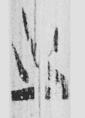之
